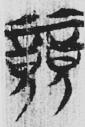競（境）
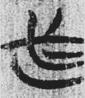必
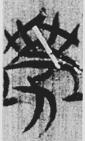○（勝）
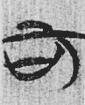可
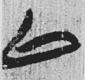㠯
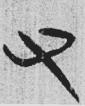又
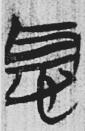怠
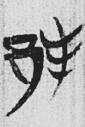邦
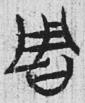周
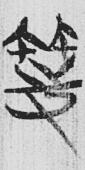等（志）
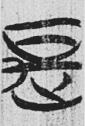是
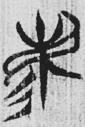廌（存）
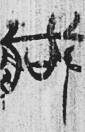戕（莊）
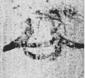公
